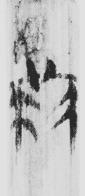𠍳
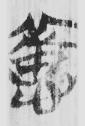惜
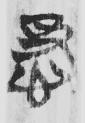快
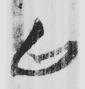㠯（以）
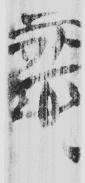{亙心}
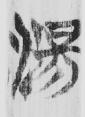湯
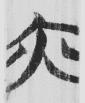亦
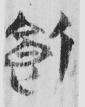飤
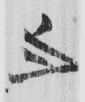之
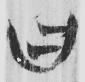曰
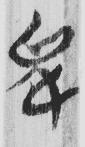允
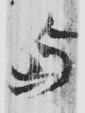此
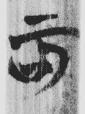可
